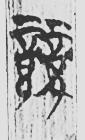競
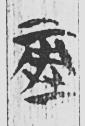坪
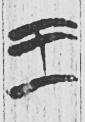王
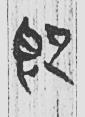即
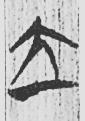立
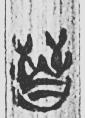晉
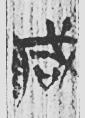戕
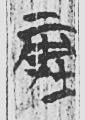坪
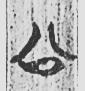公
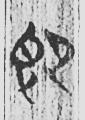即
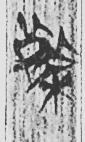殜
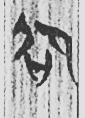卲（昭）
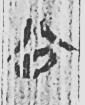公
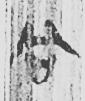冋
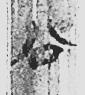公
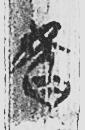{虍皆}
